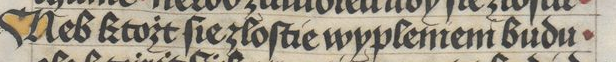Neb ktożt ſie zloſtie wyplenieni budu.
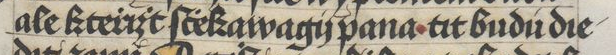ale kteṙíżt ſċekawagij pana.tit budú die¬
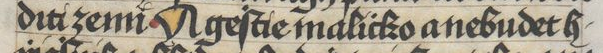diti zemi.A geẛtie maliċko a nebudet h¬
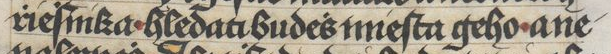ṙíeẛníka.hledati budeṡ míeſta geho.a ne¬
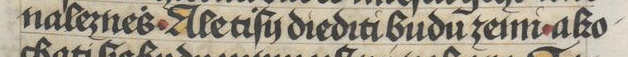nalezneṡ.Ale tiẛij diediti budu zemi.a ko¬
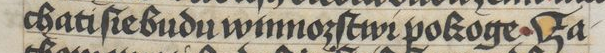chati ſie budu wmnozſtwí pokoge.Za¬
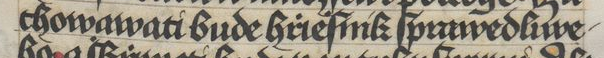chowawati bude hṙieẛník ſprawedliwe¬
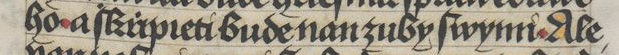ho.a ẛkṙipieti bude nan zuby ſwymi.Ale
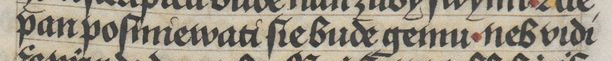pan poſmiewati ſie bude gemu.neb vidí
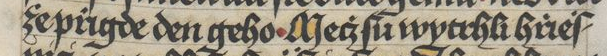Że pṙigde den geho.Mecż ſu wytrhli hṙieẛ¬
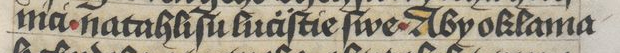nici.natahli ſú luċiẛtie ſwe.Aby oklama¬
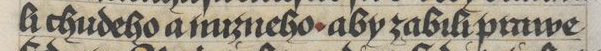li chudeho a nuzneho.aby zabili prawe¬
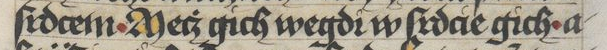ſrdcem.Mecż gich wegdi w ſrdcie gich.a¬
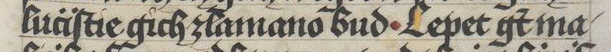luċiẛtie gich zlamano bud.Lepet ḡt ma¬
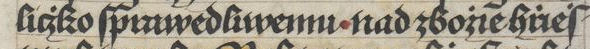licŻko ſprawedliwemu.nad zboŻie hṙieẛ¬
